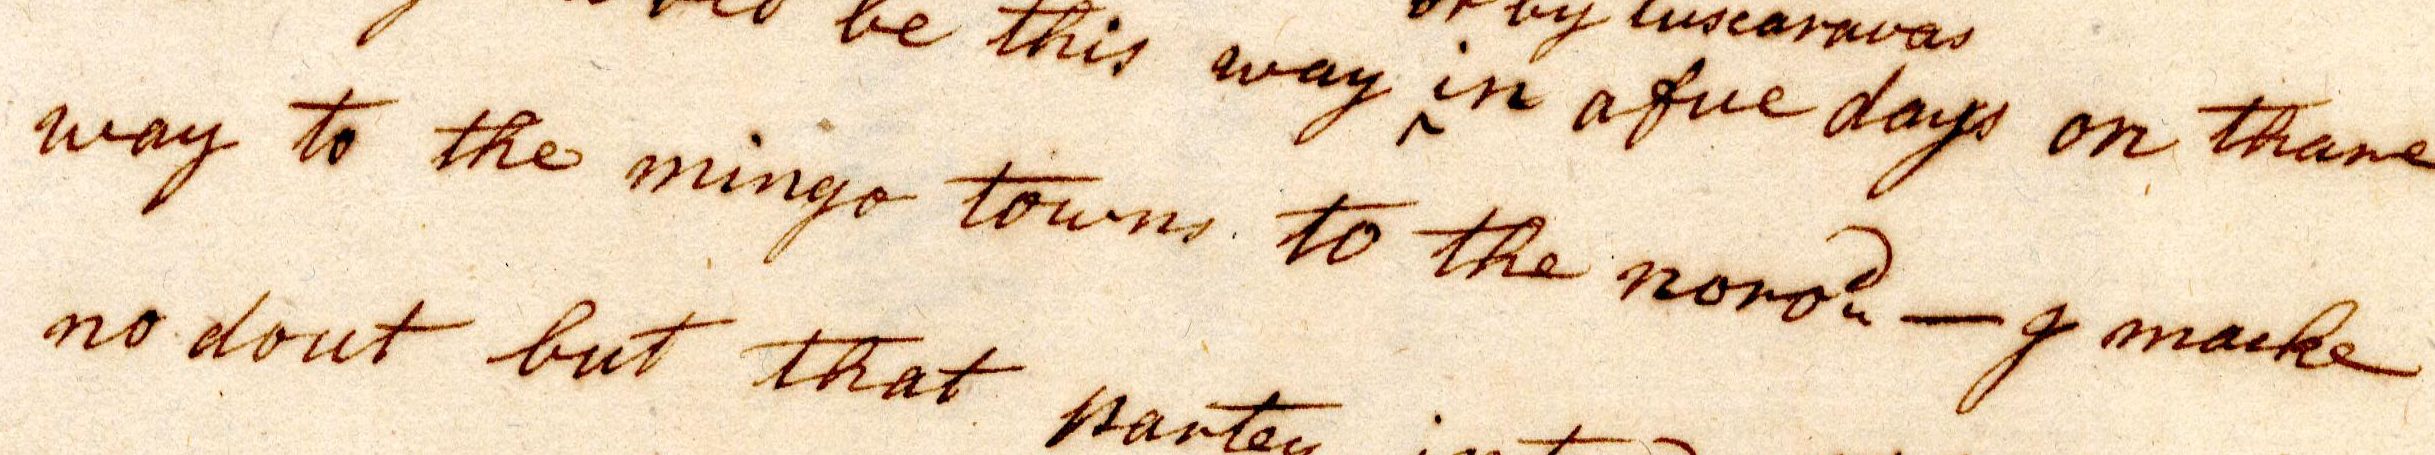way to the mingo towns to the noro^d- I macke
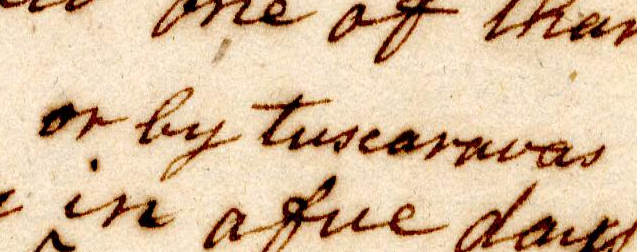or by tuscarawas
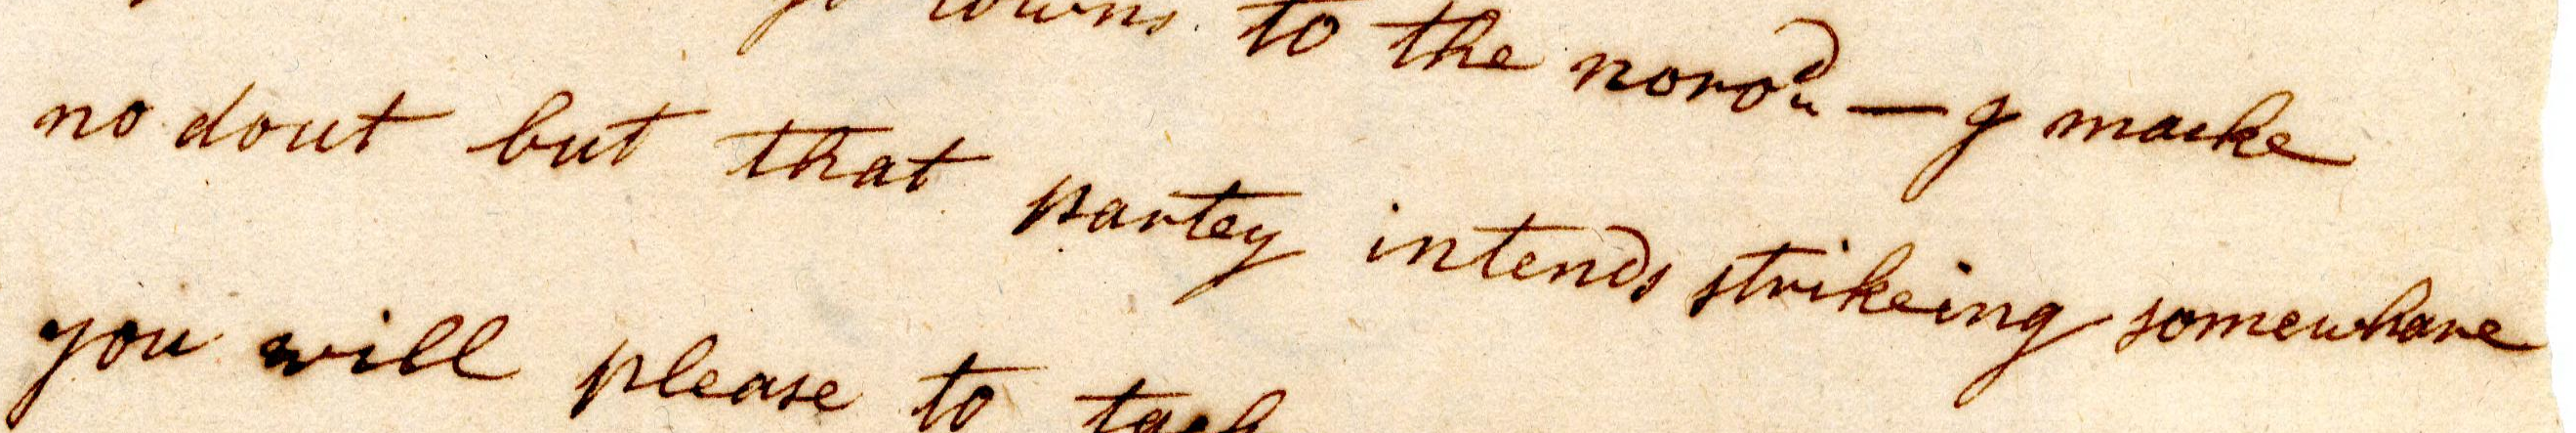no dout but that partey intends strikeing somewhere
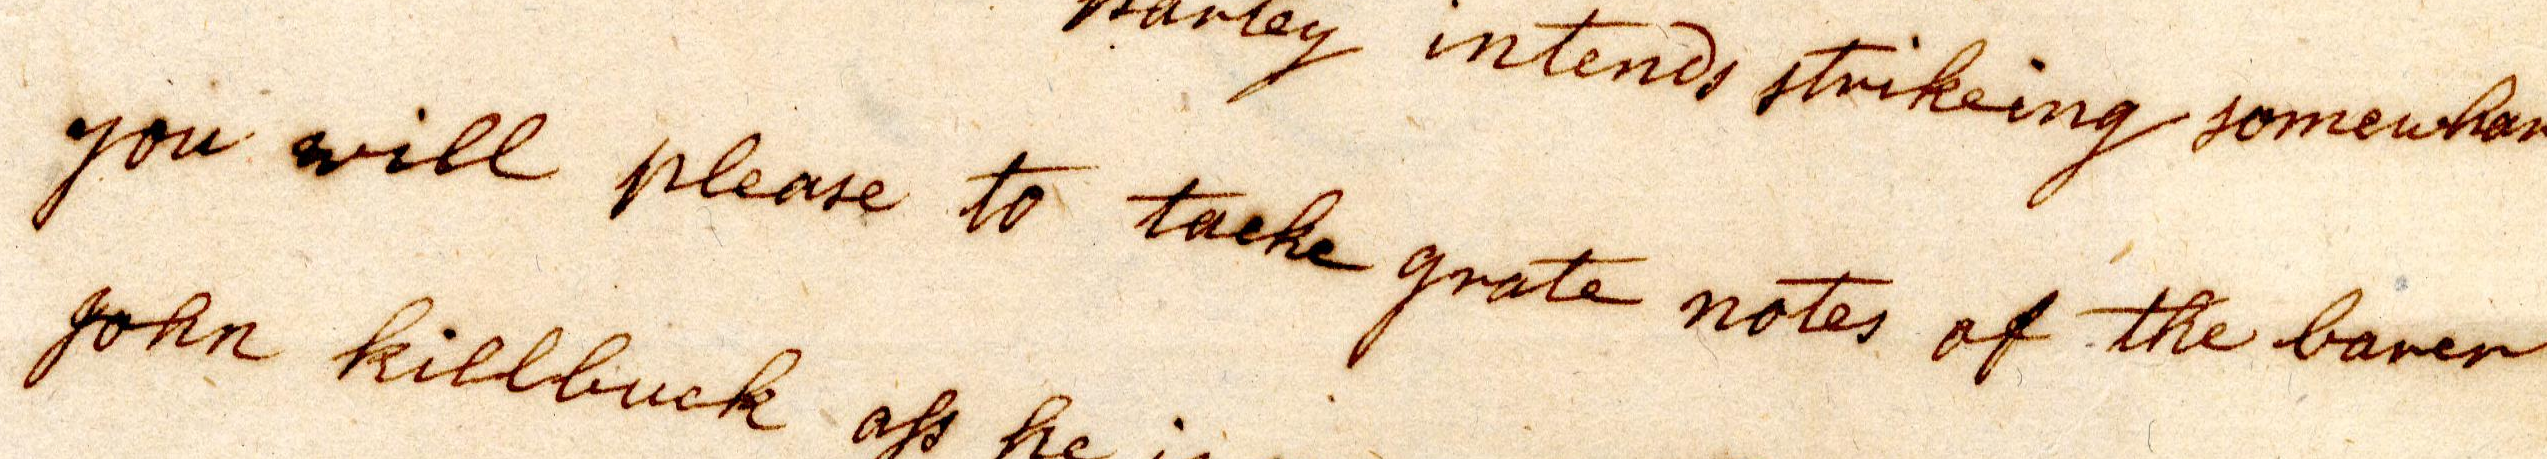you will please to tacke grate notes of the barer
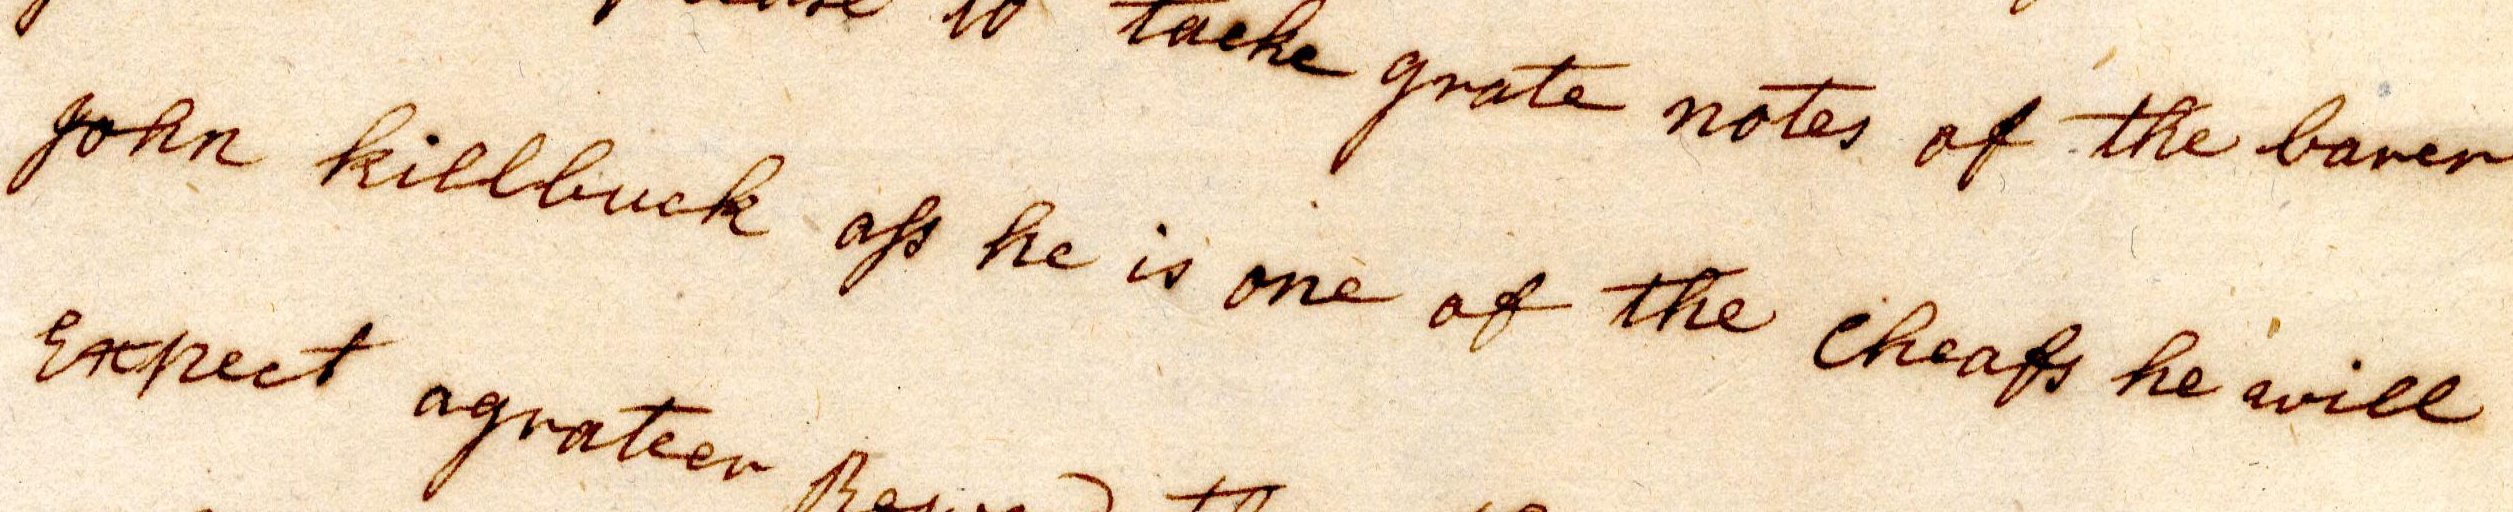John killbuck ass he is one of the cheafs he will
